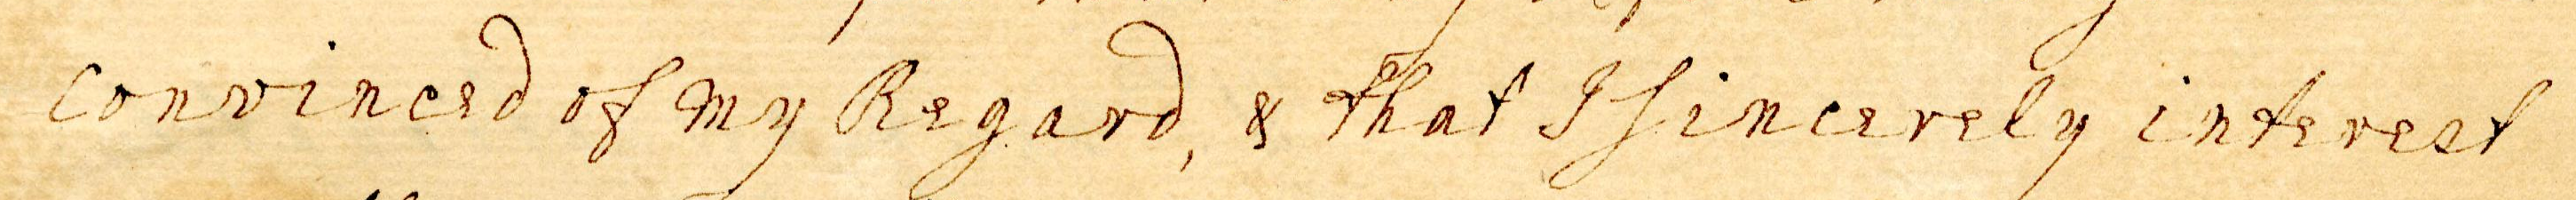convinced of my Regard & that I sincerely interest
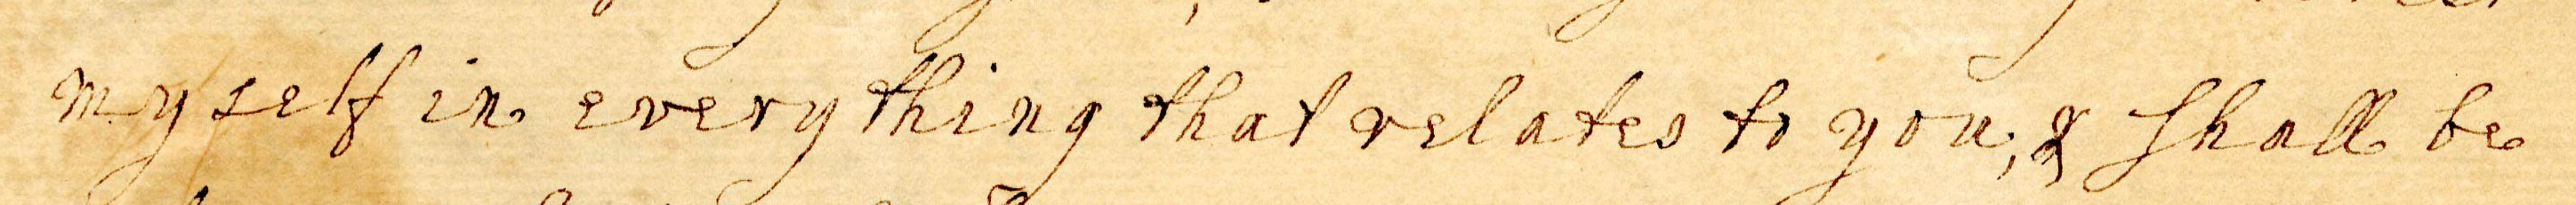myself in everything that relates to you; & shall be
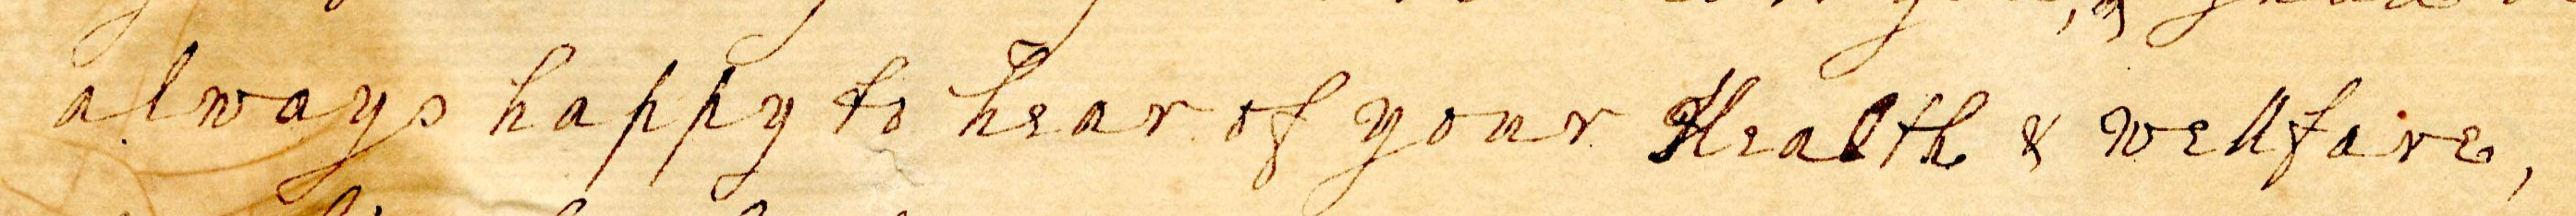always happy to hear of your Health & welfare,
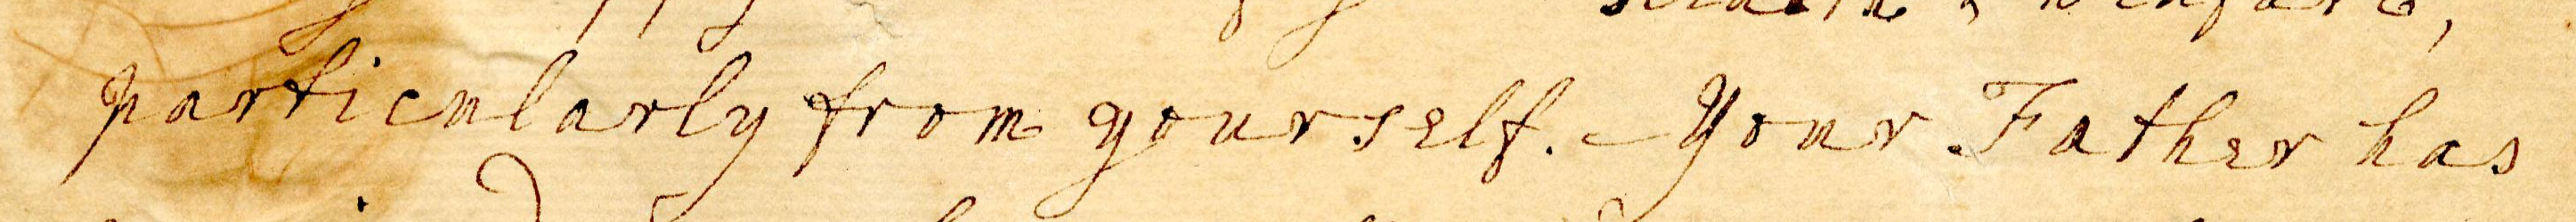particularly from yourself. Your Father has
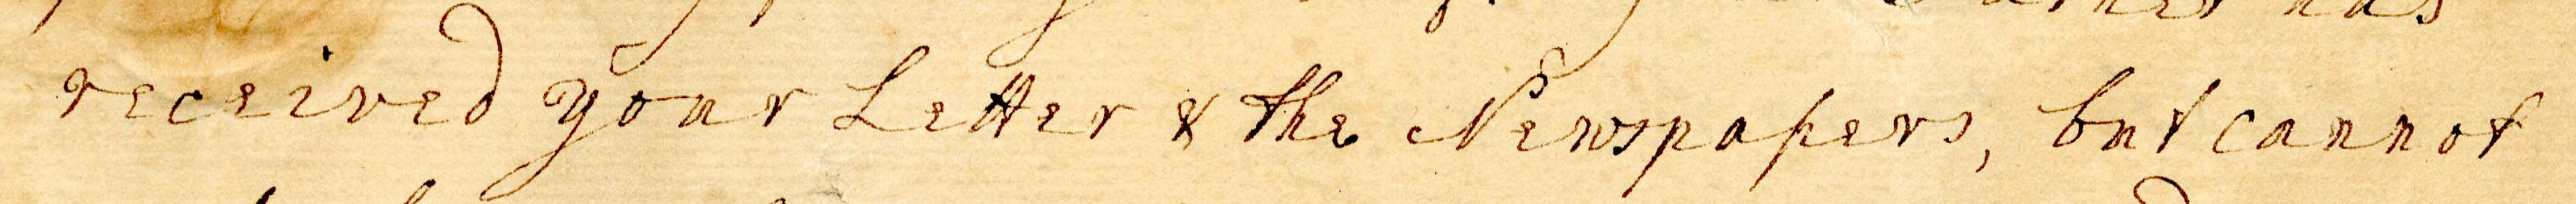received your Letter & the Newspapers, but cannot
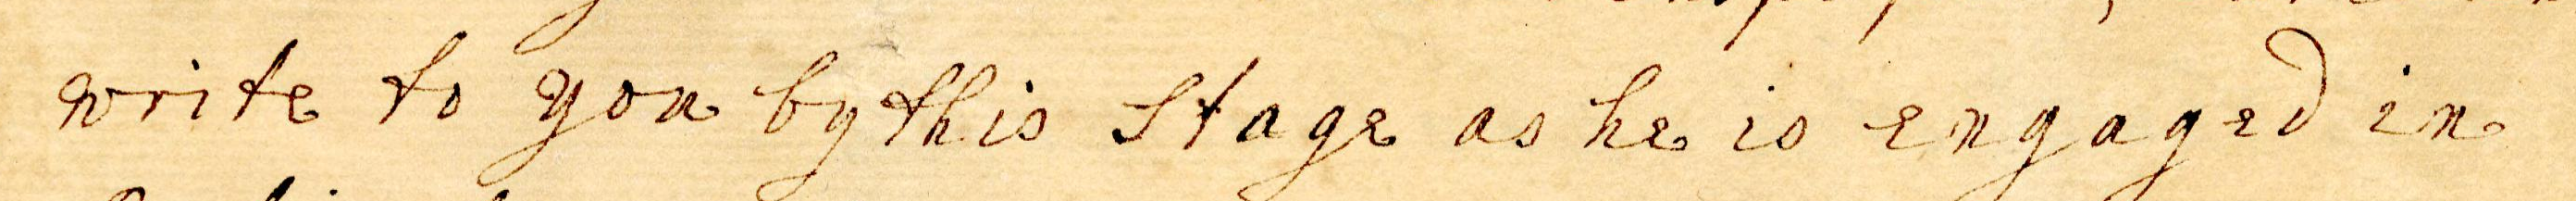write to you by this stage as he is engaged in
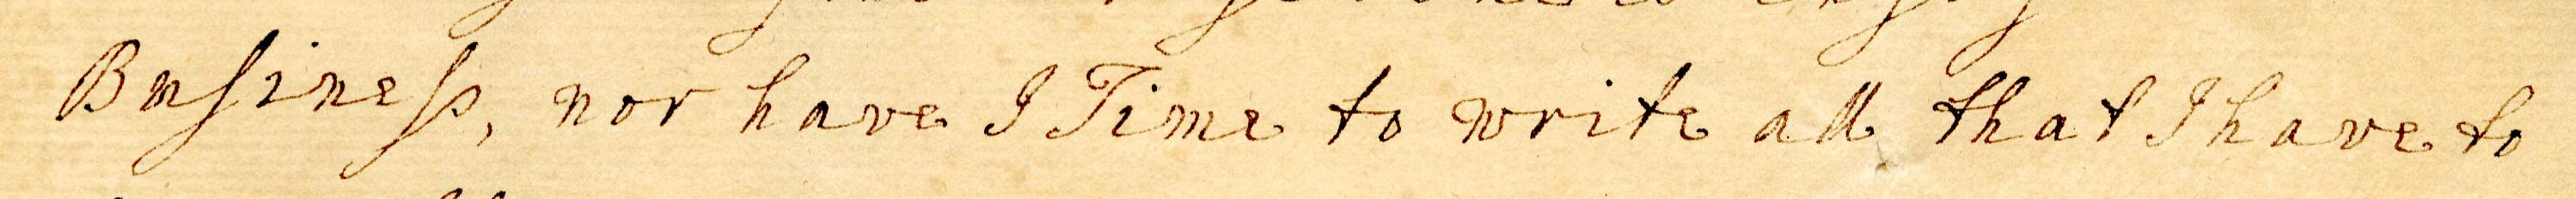Business, nor have I time to write all that I have to
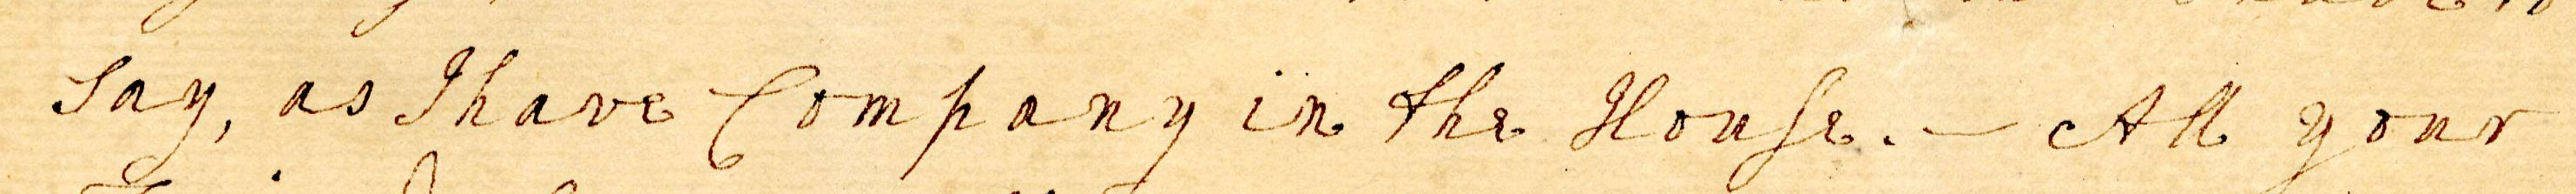say, as I have Company in the House.- All your
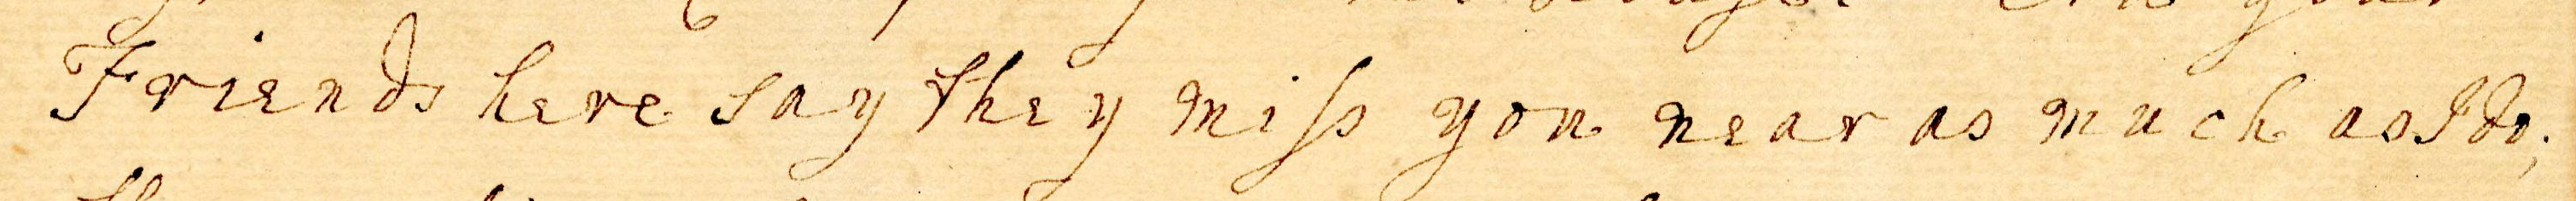Friends here say they miss you near as much as I do
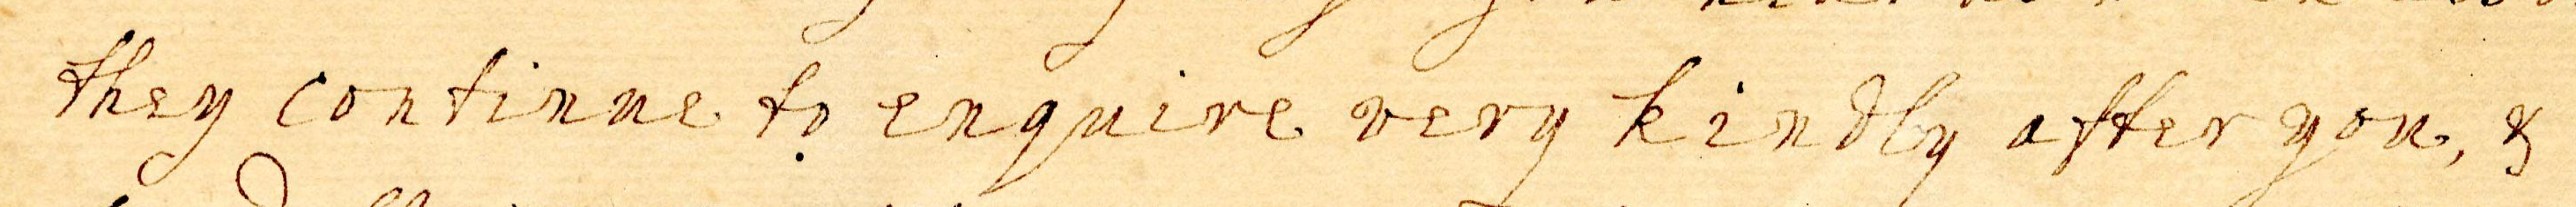they continue to enquire very kindly after you, &
